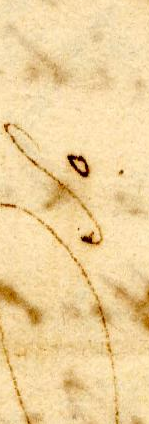To
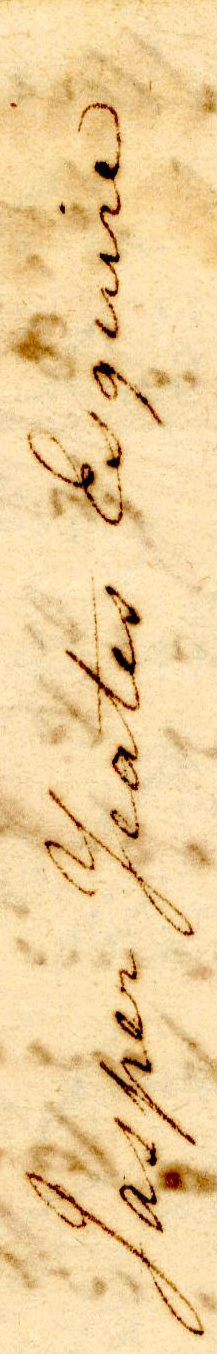Jasper Yeates Esquire
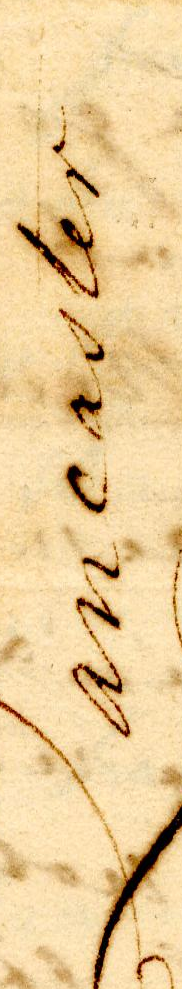Lancaster
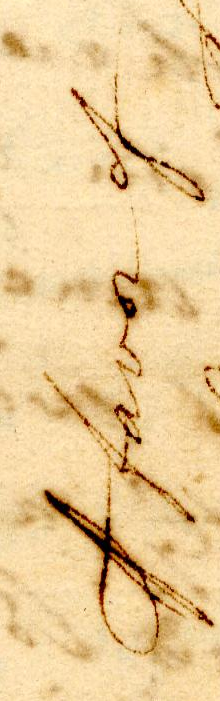Per favor of
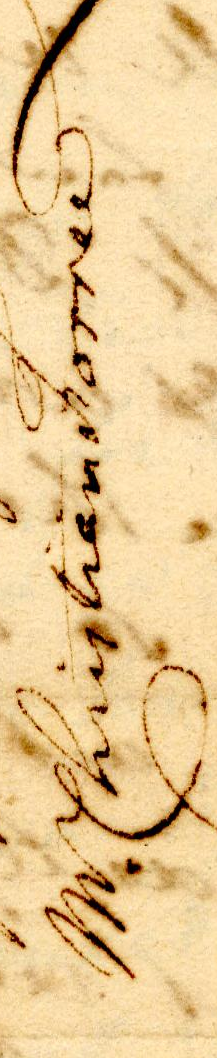M^r. Christian Forree
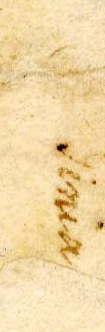Tinian
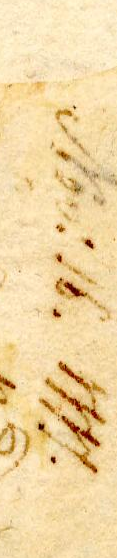Nov. 16. 1777.
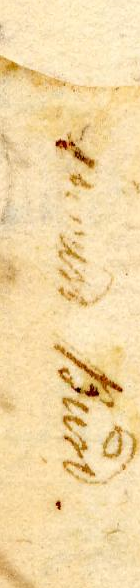Edward Burd.
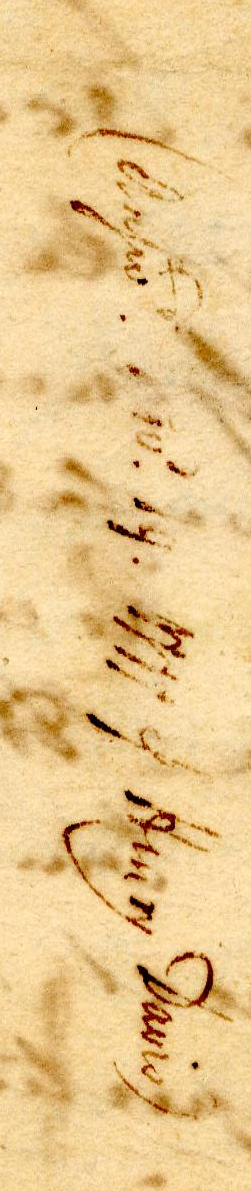(Answ^d Nov. 19. 1777 per Henry Davis)
